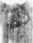其（箕）
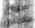二
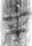才（在）
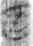{匚去}
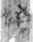{阝咸}
